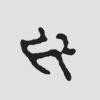女
